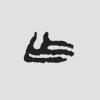乍
